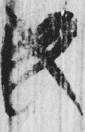母
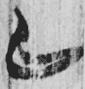㠯（以）
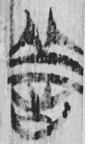善
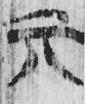亓（其）
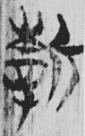新（親）
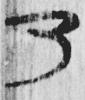乃
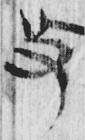及
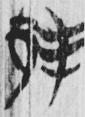邦
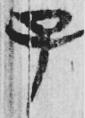子
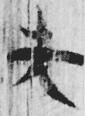○（堯）
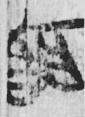○（聞）
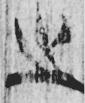之
